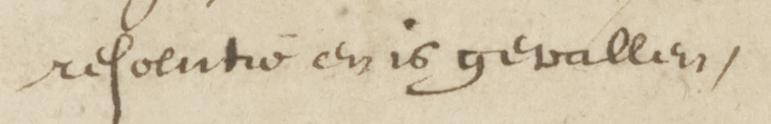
resolutie en is gevallen.
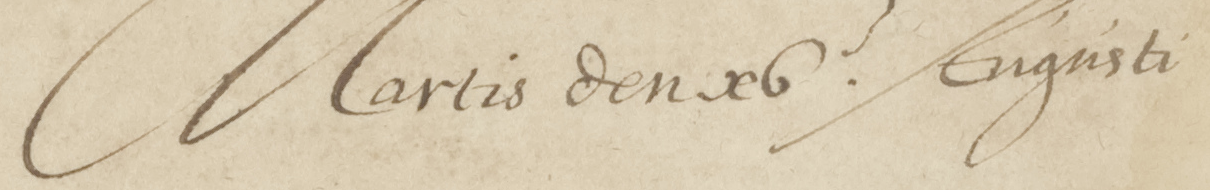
Martis den xven. Augusti
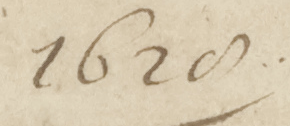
1628.
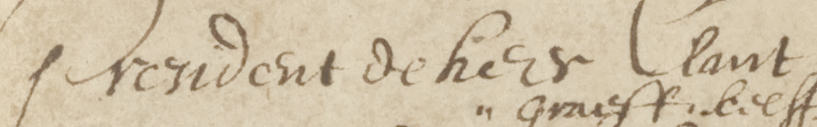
President de heer Clant
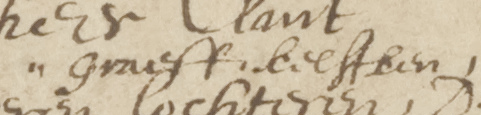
,,Graeff, Kelffken
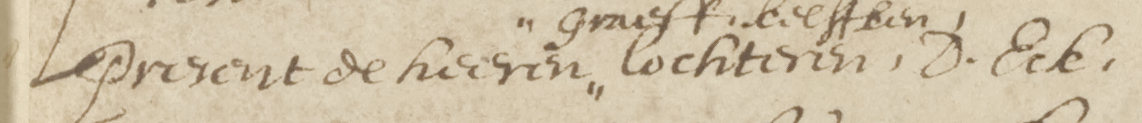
Present de heeren,, lochteren, D. Eck,
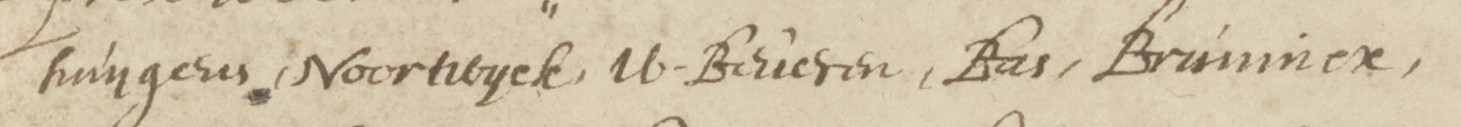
huygens Noortwyck, V. Brienen, Bas, Brunincx,
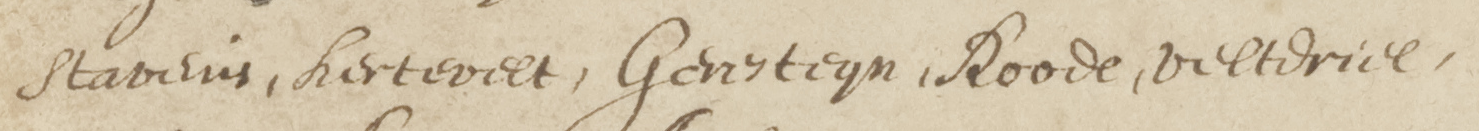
Stavenis, hertevelt, Geresteyn, Roode, Veltdriel,
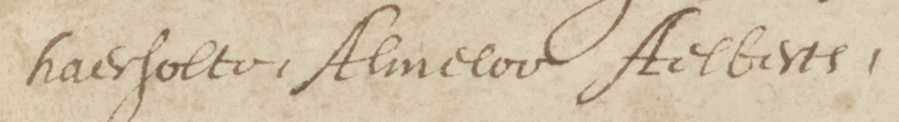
haersolto, Almeloo, Aelberts,
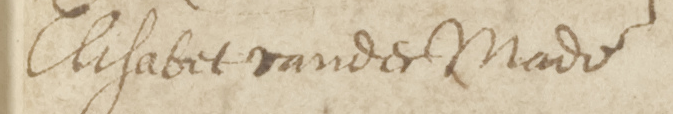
Elisabet vander Made
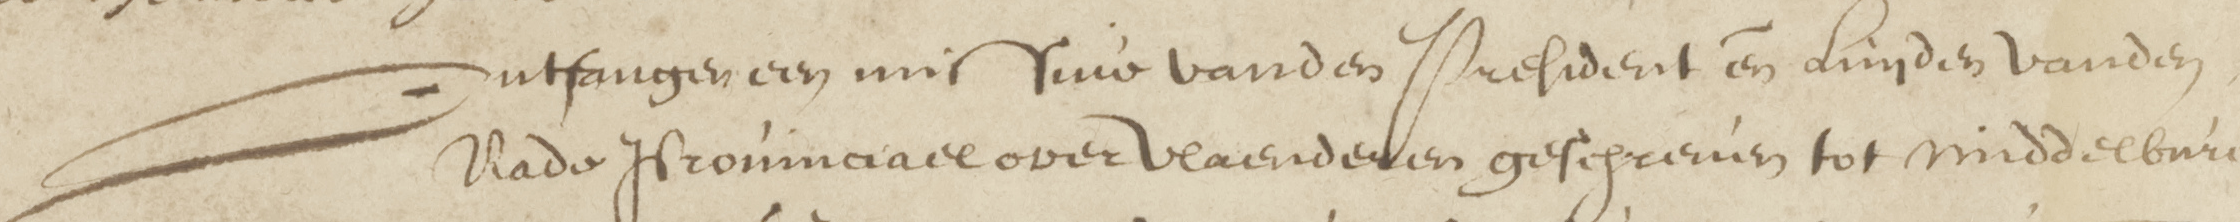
Ontfangen een missiue vanden President en Luyden vanden
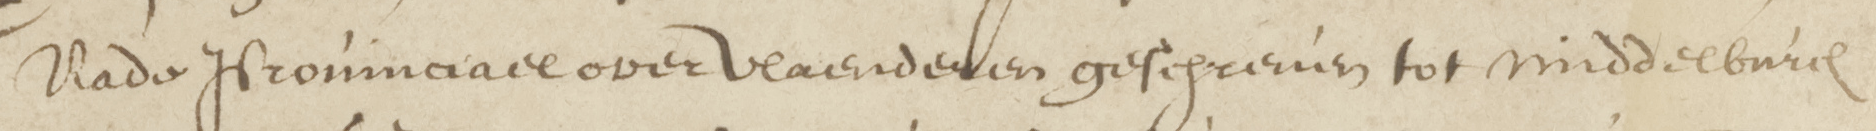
Rade Prouinciael over Vlaenderen geschreuen tot middelburch
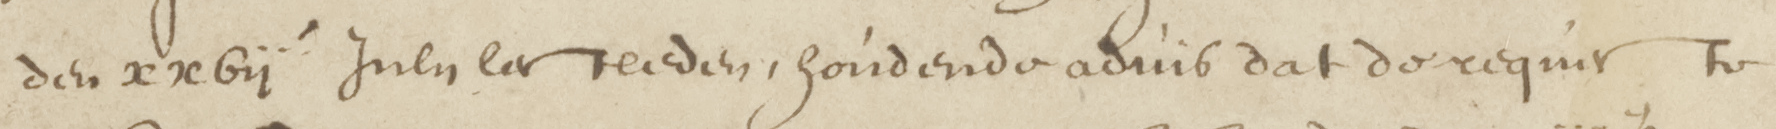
den xxvije July lestleden, houdende aduis dat de requeste
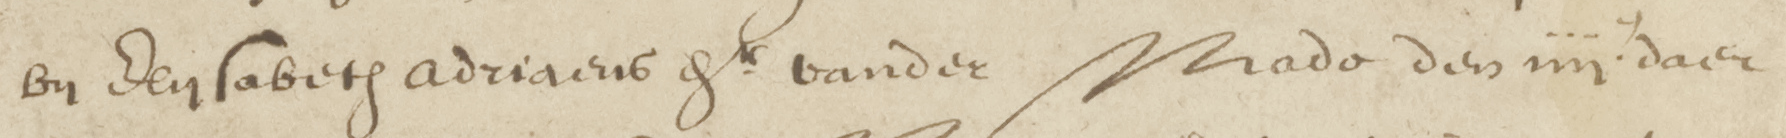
by Elysabeth Adriaensdr. vander Made den iiije daer
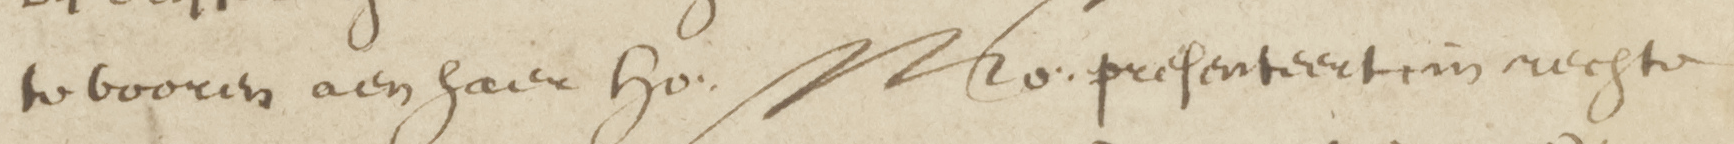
te vooren aen haer ho:Mo: presenteert, in rechte
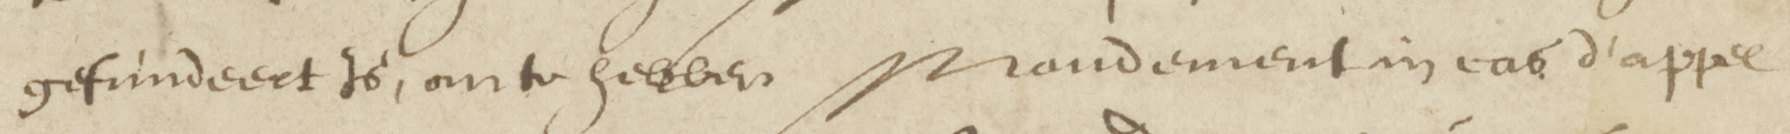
gefundeert Is, om te hebben Mandement in cas d'appel
